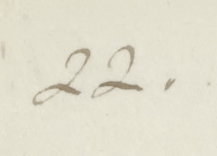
22.
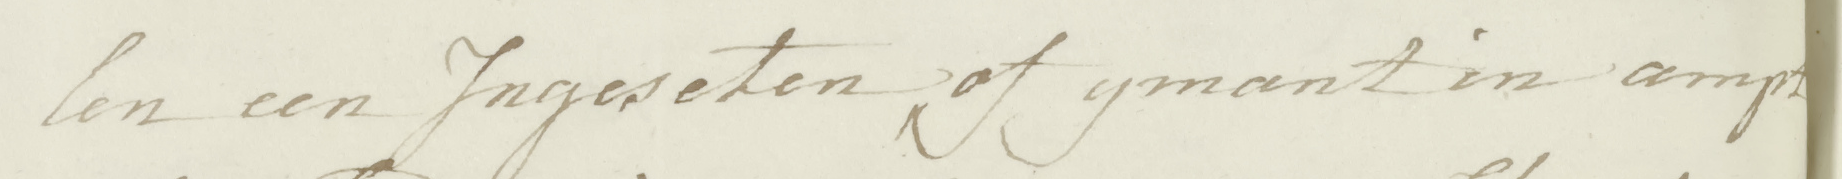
len een Ingeseten of ymant in ampt
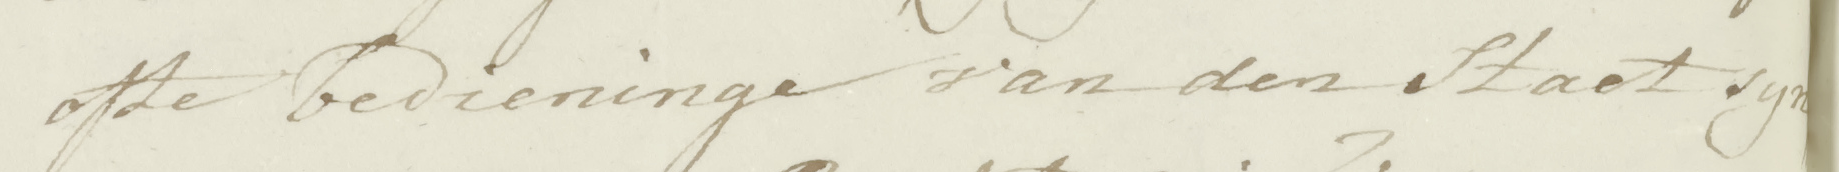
ofte bedieninge van den Staet syn
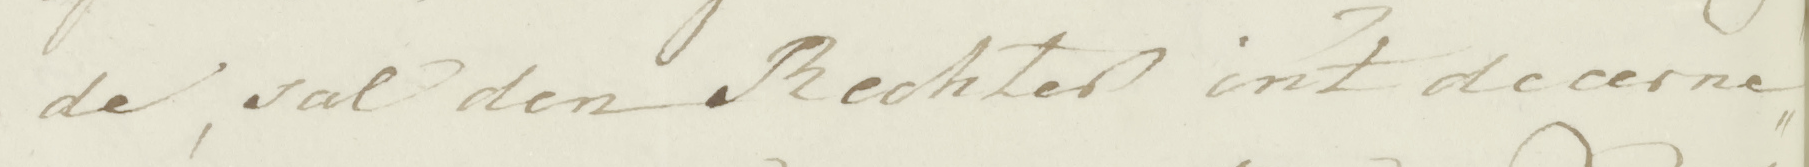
de, sal den Rechter in't decerne„
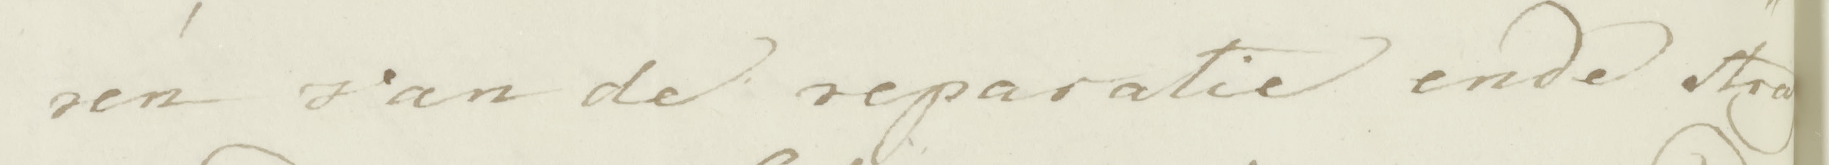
ren van de reparatie ende Stra
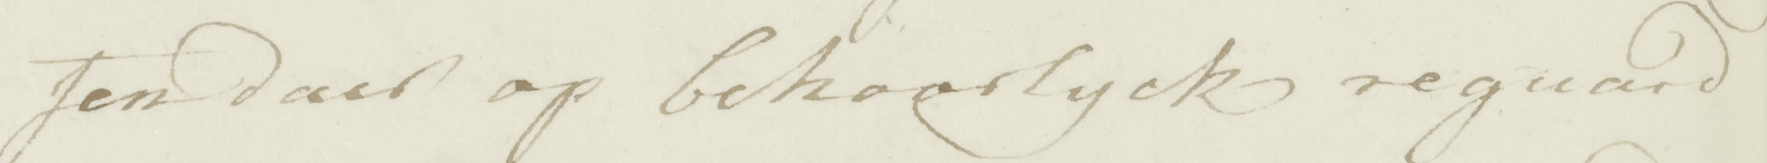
fen daer op behoorlijck reguard
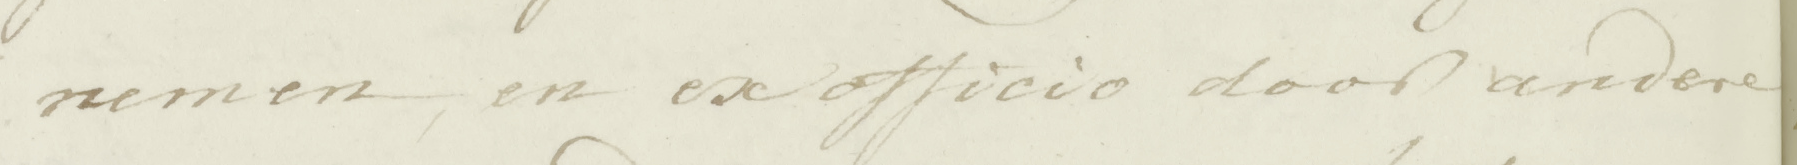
nemen, en ex officio door andere
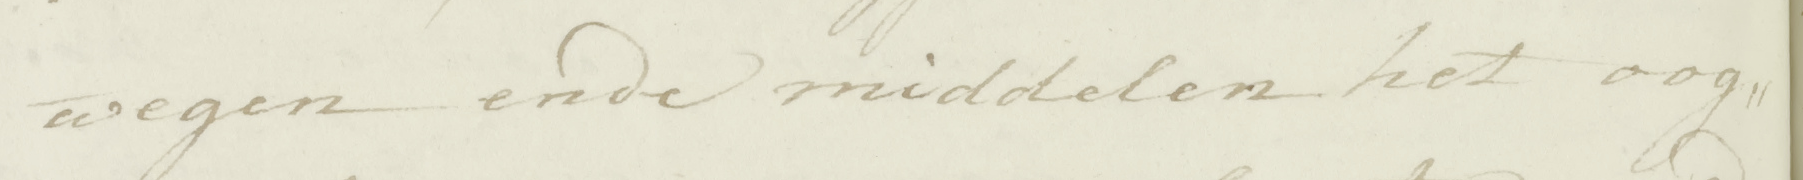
wegen ende middelen het oog„
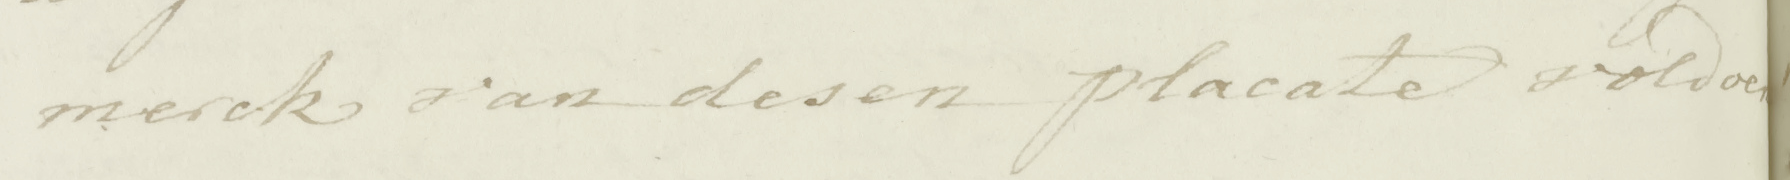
merck van desen placate voldoen
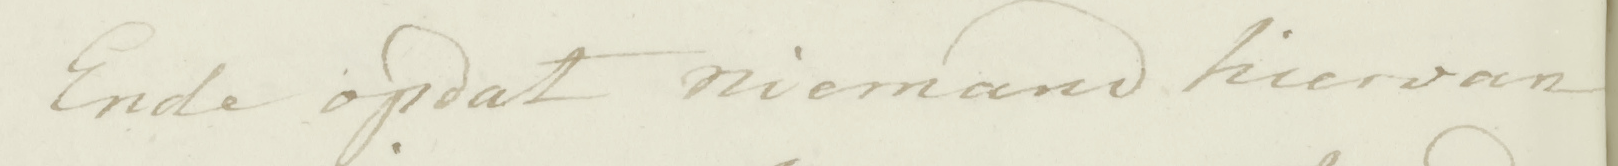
Ende opdat niemand hiervan
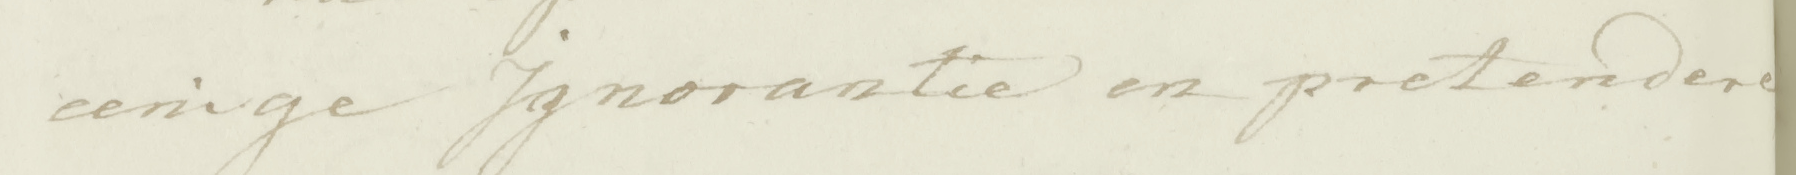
eenige Ignorantie en pretendere
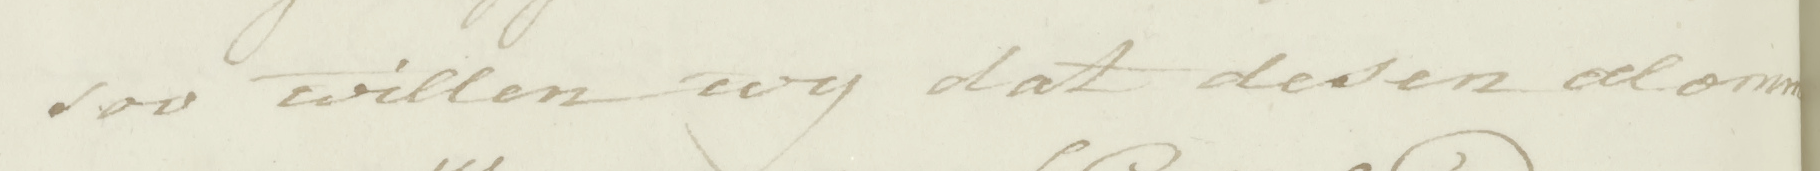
soo willen wij dat desen alomm
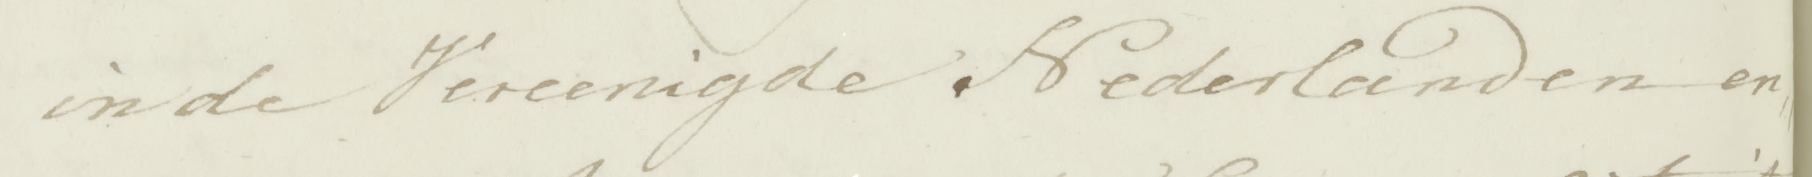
in de Vereenigde Nederlanden en
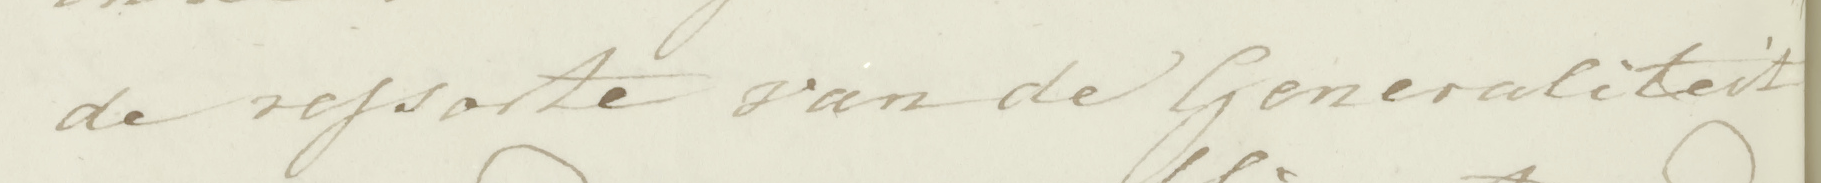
de ressorte van de Generaliteit
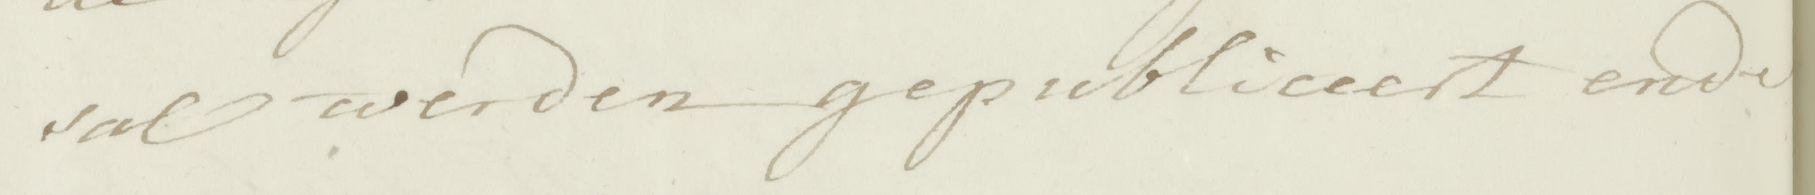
sal werden gepubliceert ende
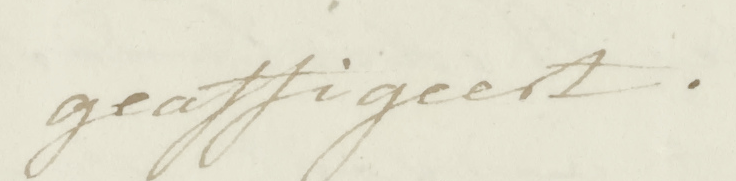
geaffigeert.
